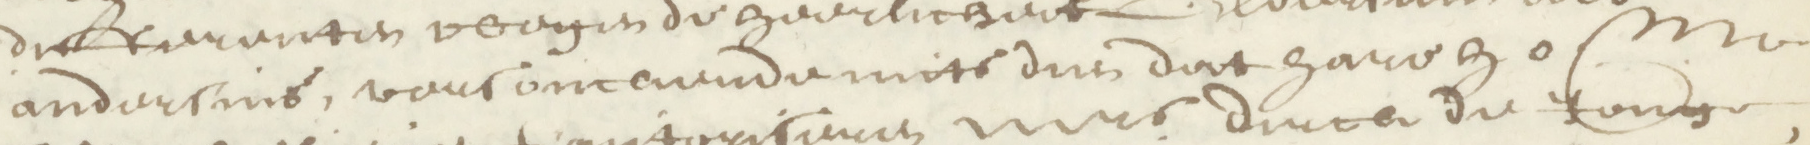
andersins, versouckende mits dien dat hare ho:Mo:
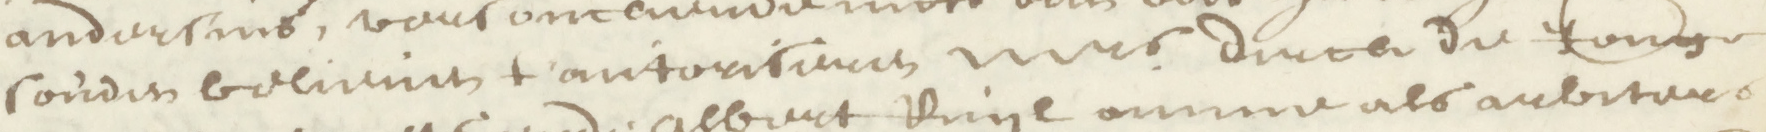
souden belieuen t'autoriseren mrs dirck de Jonge,
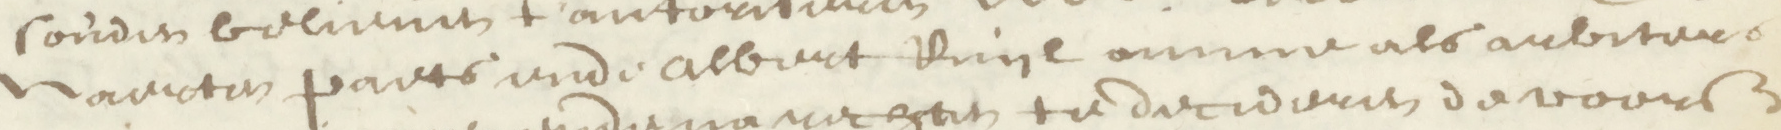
Maerten paets ende albert Ruyl omme als arbiters
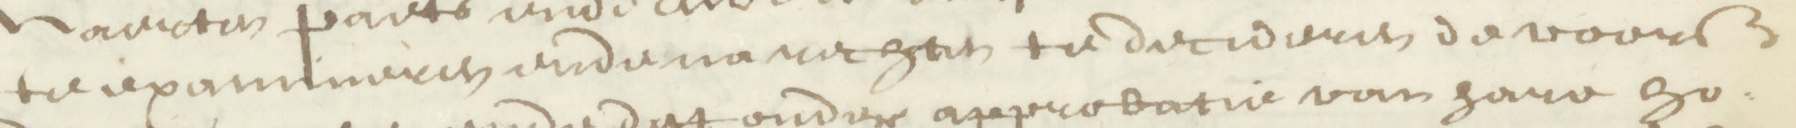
te examineren ende na rechten te decideren de voors
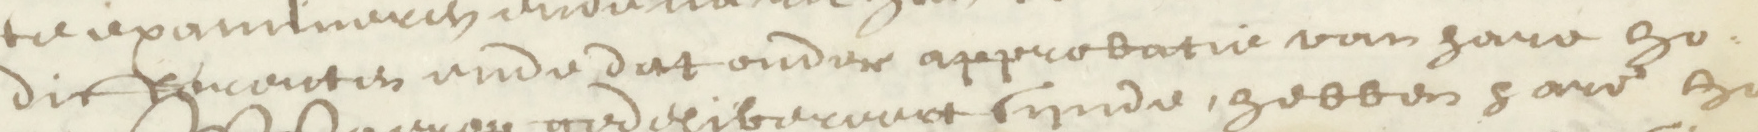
differenten ende dat onder approbatie van hare Ho:
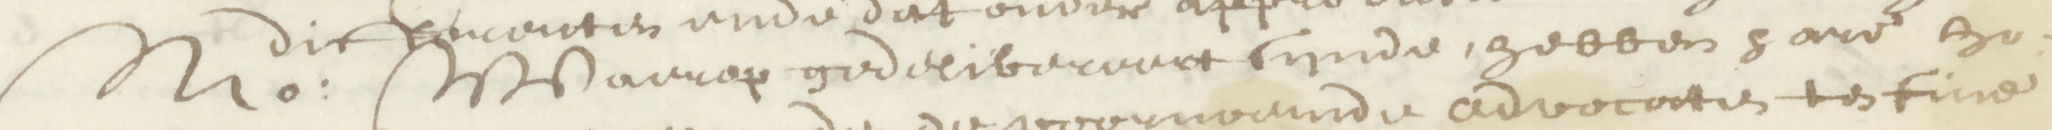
Mo: Waerop gedelibereert synde, hebben hare Ho:
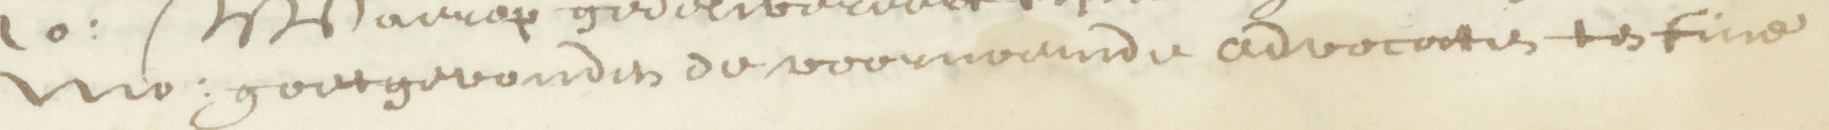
Mo: goetgevonden de voornoemde advocaten ten fine
